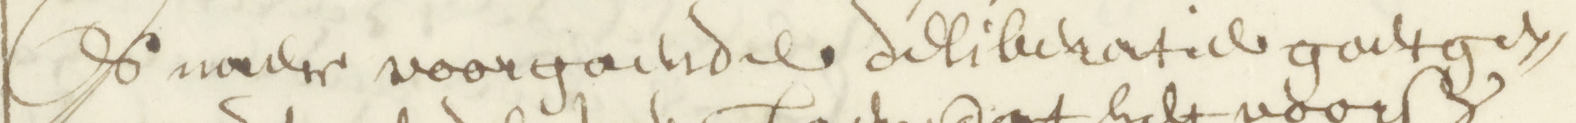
Is naer voorgaende deliberatie goetge,,
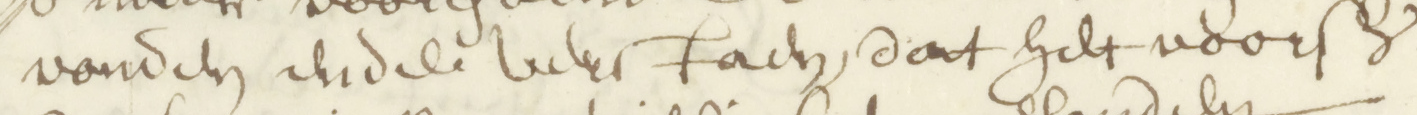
vonden ende verstaen, dat het voorsz
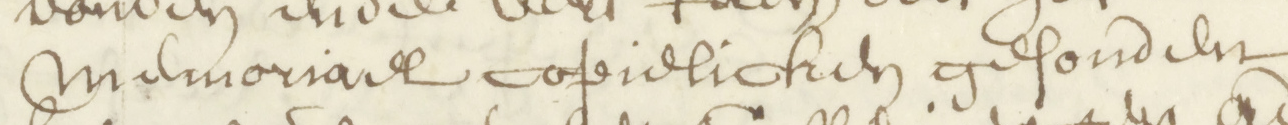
memoriael copielicken gesonden
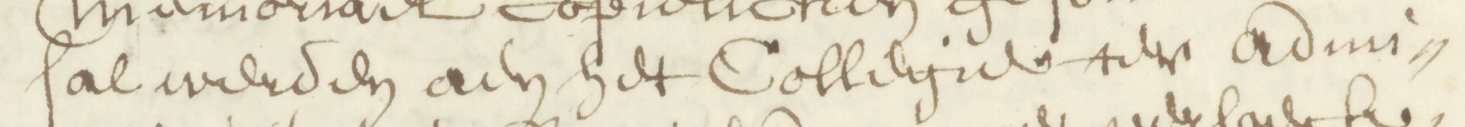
sal werden aen het Collegie ter Admi,,
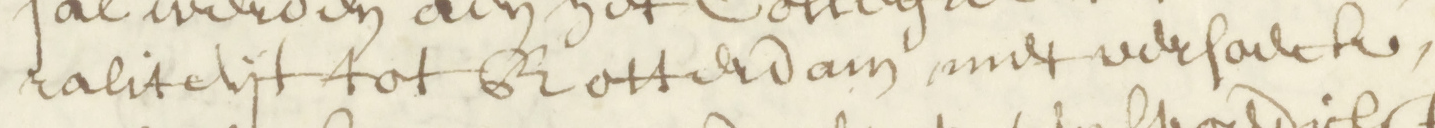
raliteijt tot Rotterdam met versoeck,
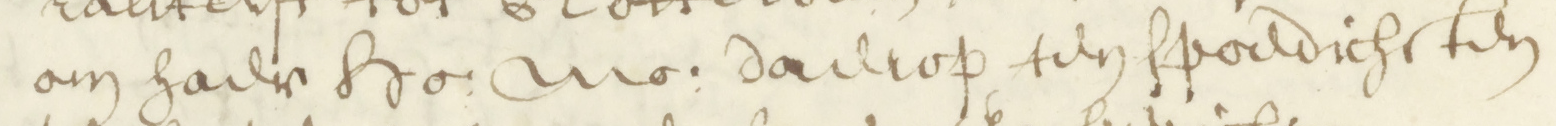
om haer Ho:Mo: daerop ten spoedichsten
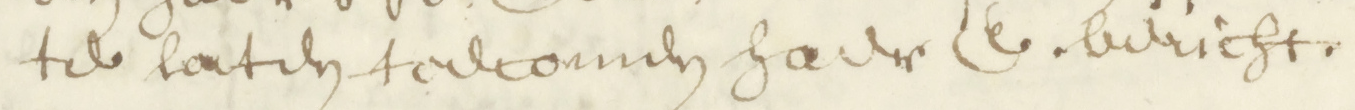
te laten toecomen haer E. bericht.
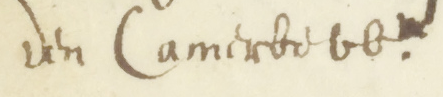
den Camerbewr.
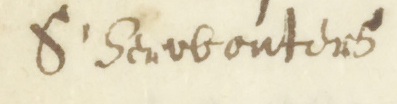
S'herwouters
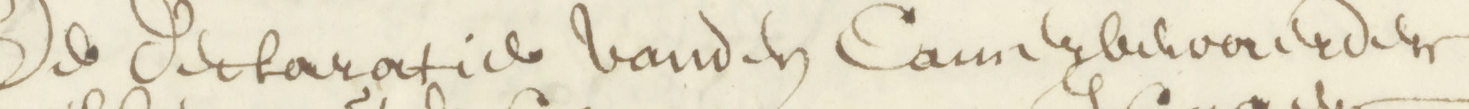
De declaratie vanden camerbewaerder
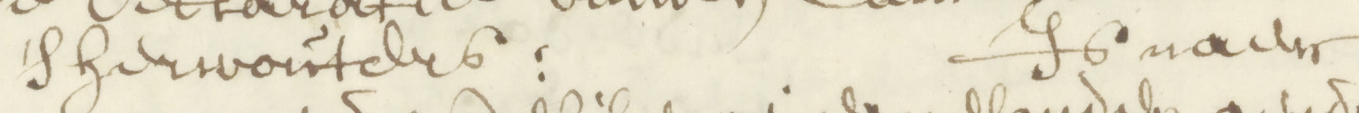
'sherwouters: Is naer
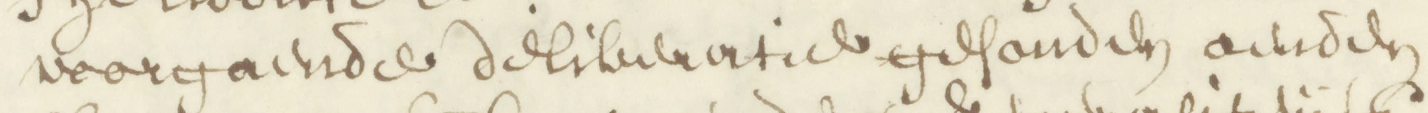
voorgaende deliberatie gesonden aenden
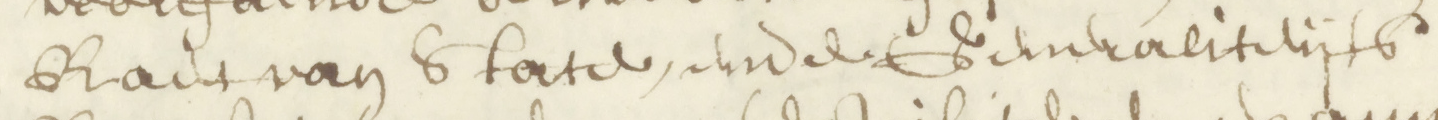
Raet van State, ende Generaliteijts
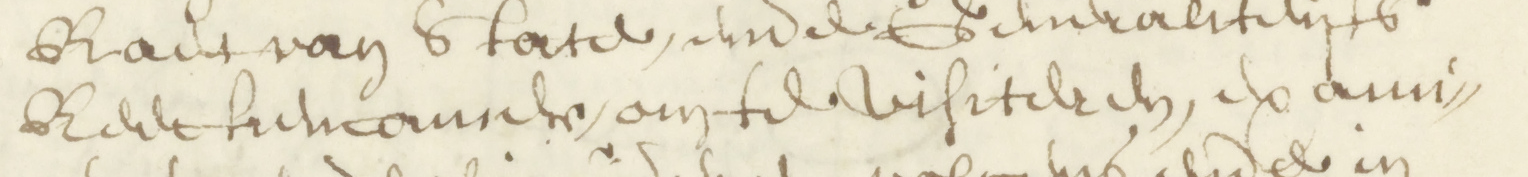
Reeckencamer, om te visiteren, exami„
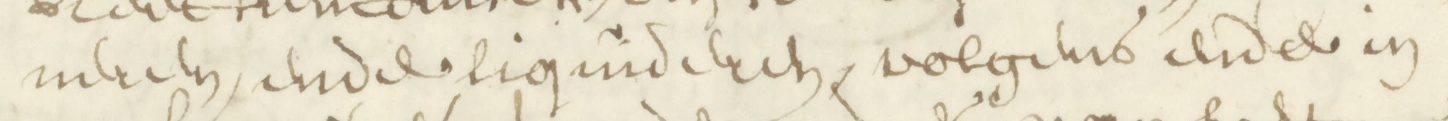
neren, ende liquideren, volgens ende in
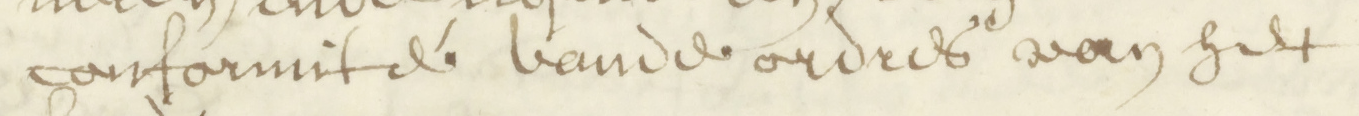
conformité vande ordres van het
